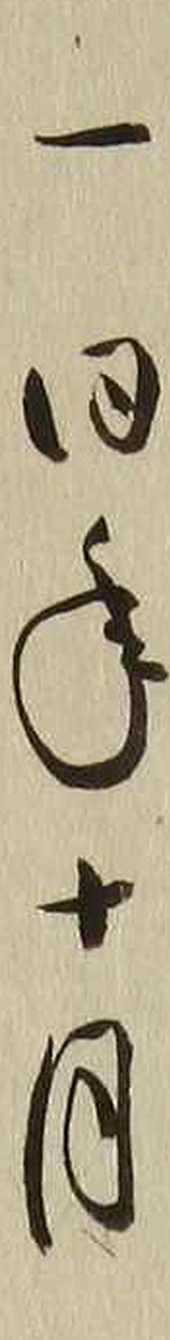一同年十月
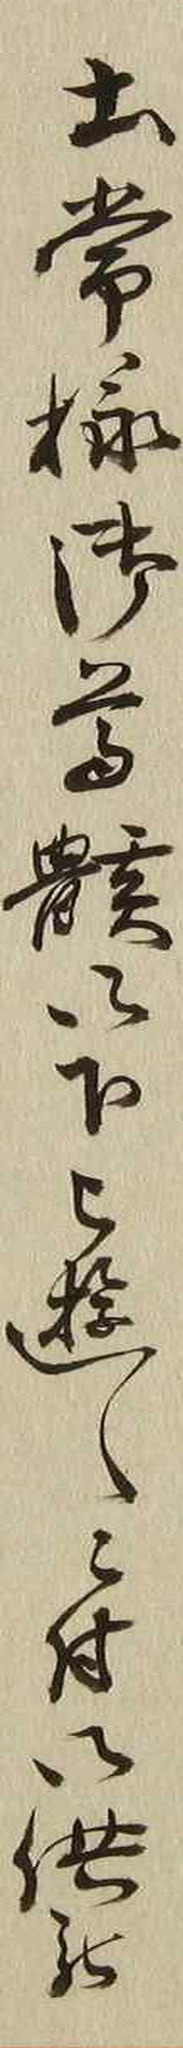土常様御十尊骸御下被遊候ニ付御供被
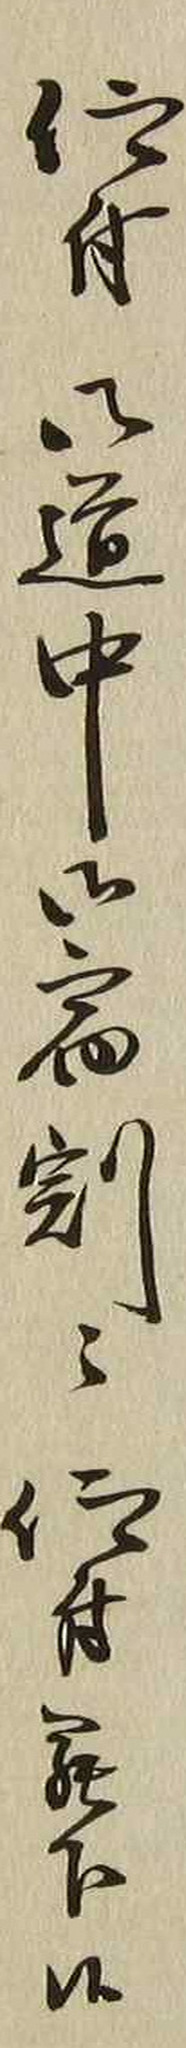仰付御道中御宿割ニ仰付罷下候
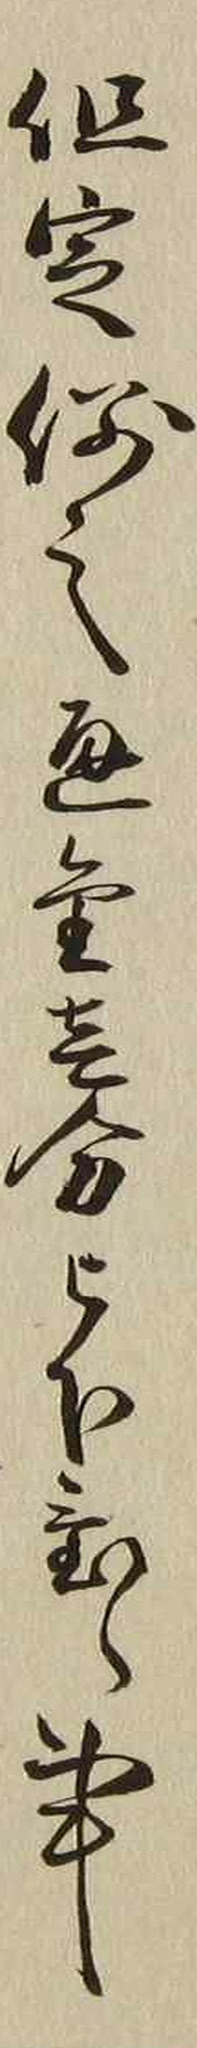但定例之通金弐分被下置候事
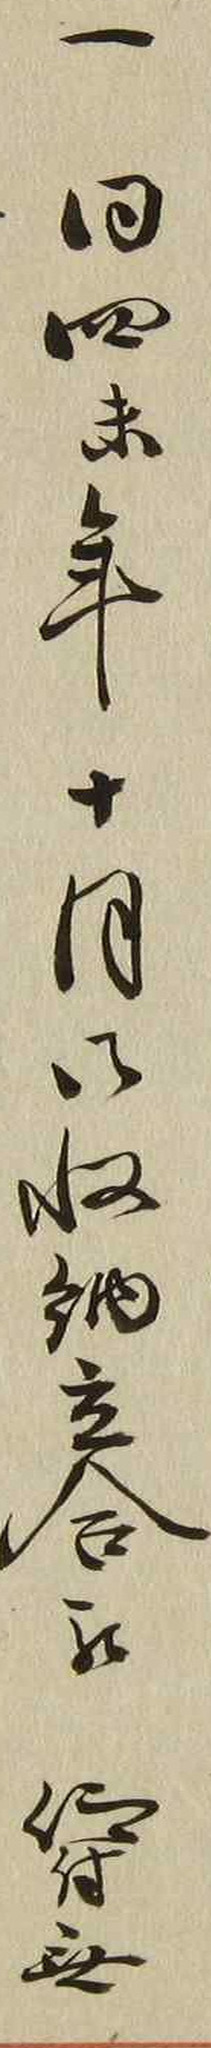一同四未年十月御収納立合被仰付無
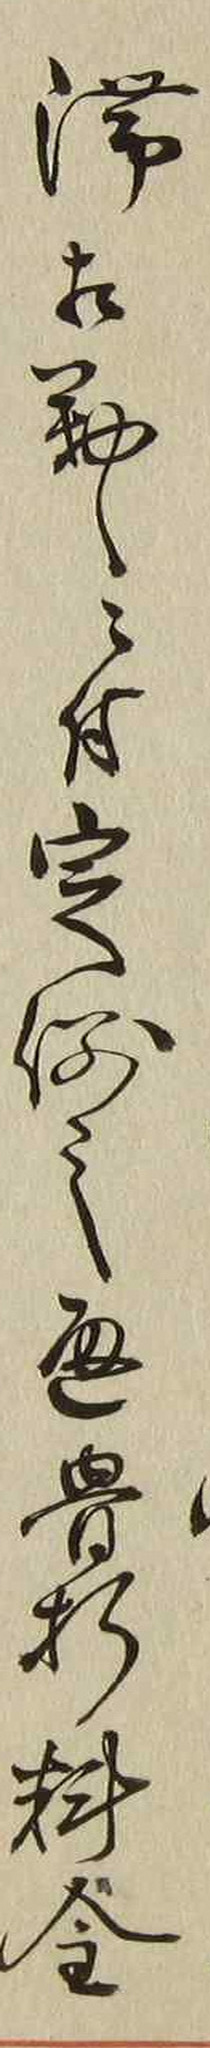滞相勤候ニ付定例之通骨折料金
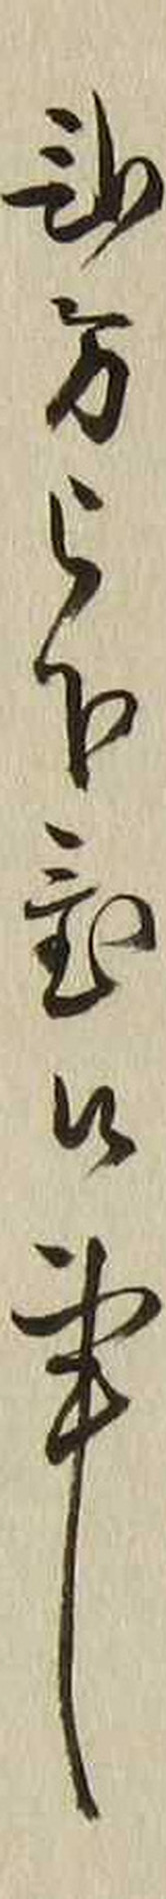弐分被下置候事
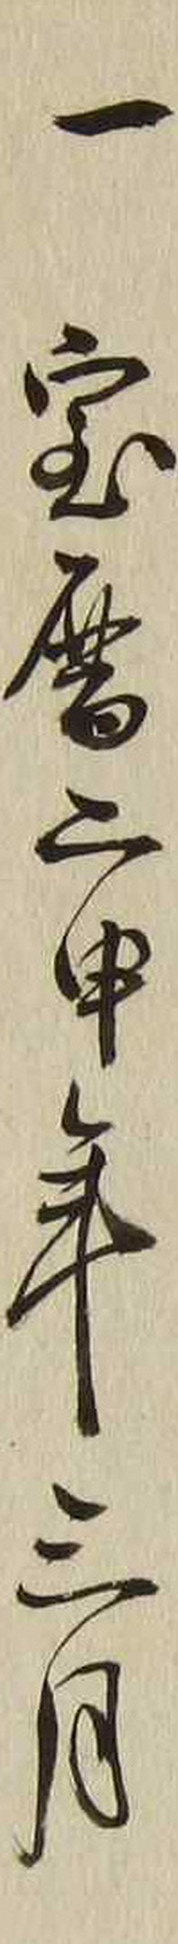一宝暦二申年三月
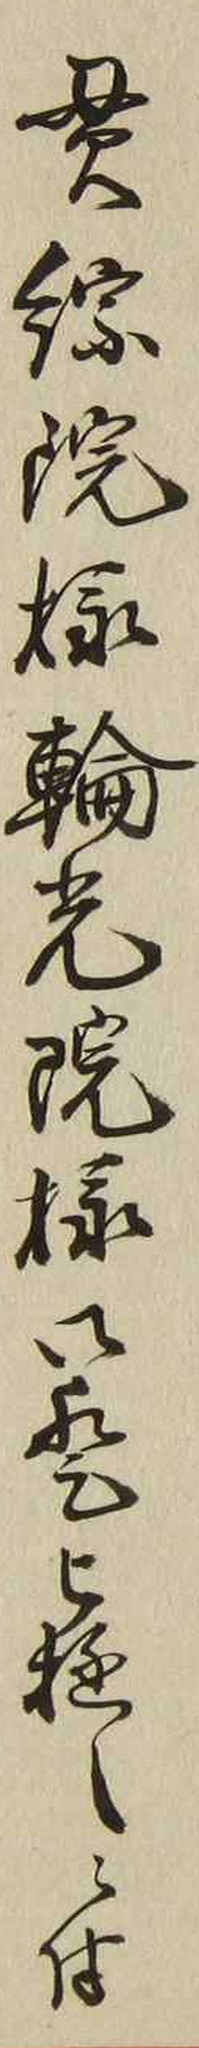貫綜院様輪光院様御登被遊候ニ付
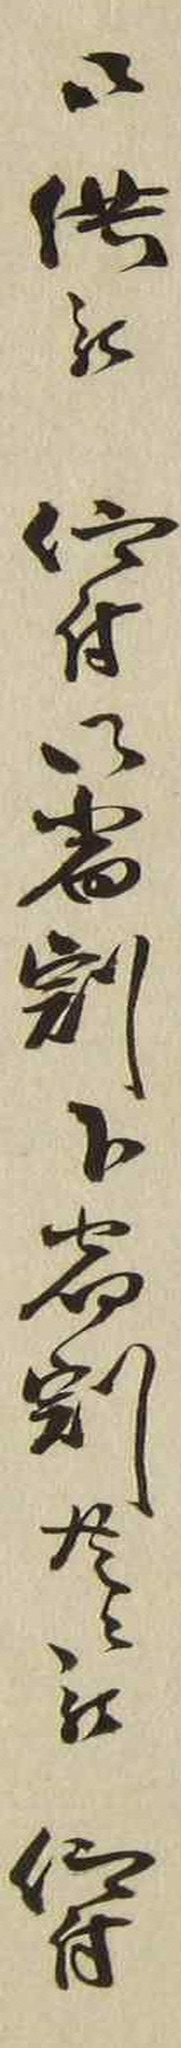御供被仰付御宿割下宿割共ニ被仰付

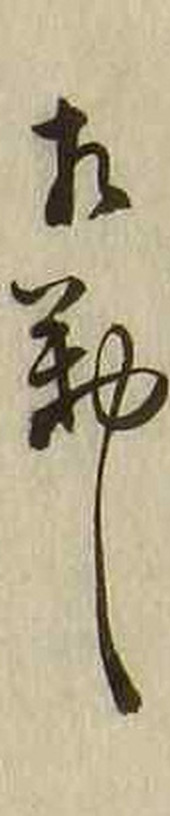相勤候
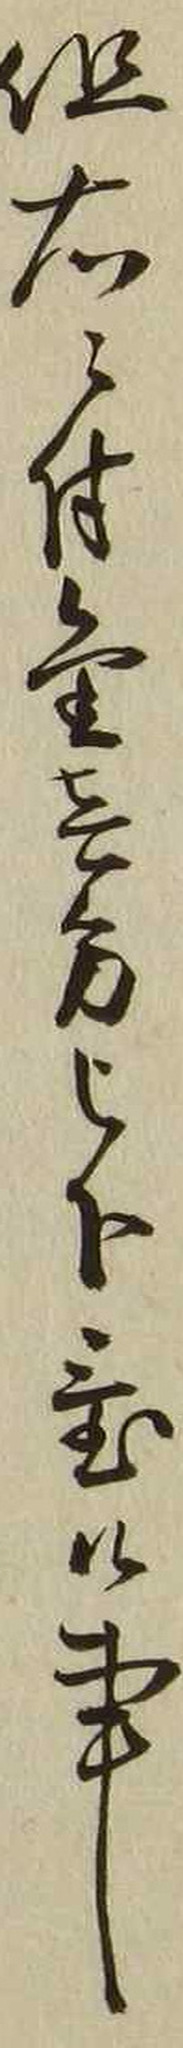但右ニ付金壱分被下置候事
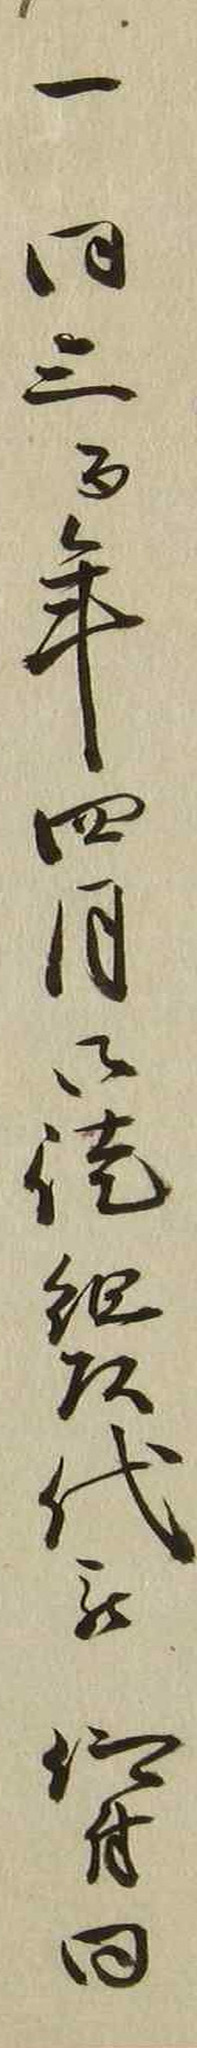一同三酉年四月御徒組頭代被仰付同
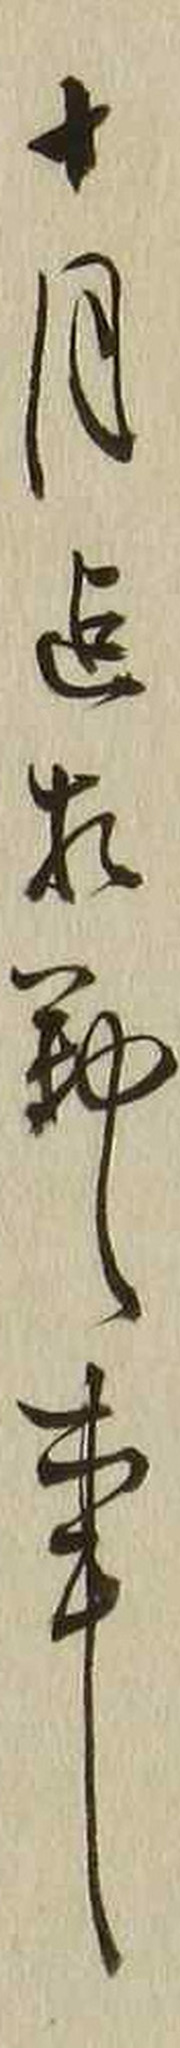十月迄相勤候事
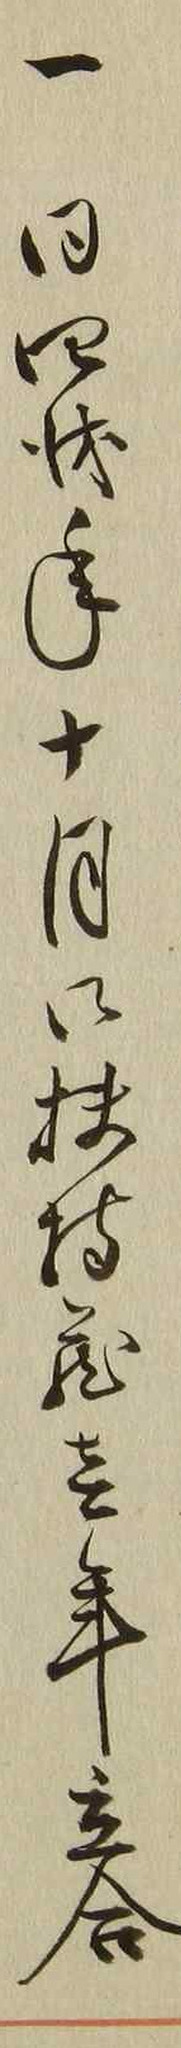一同四戌年十月御扶持藏壱年立合
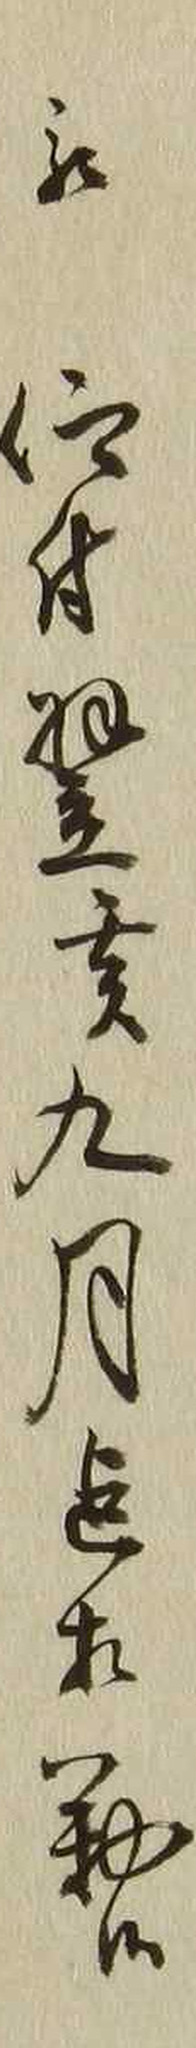被仰付翌亥九月迄相勤候
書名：諸士系譜　巻之65　ち之部1
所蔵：会津若松市立会津図書館
